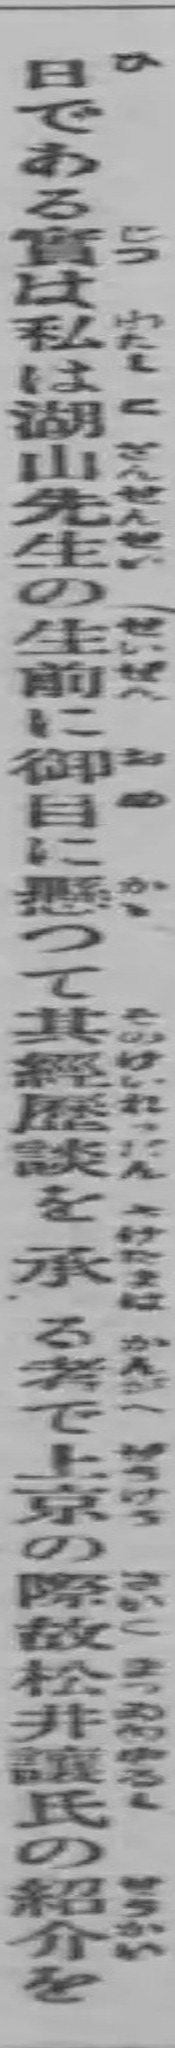日である実は私は湖山先生の生前に御目に懸つて其経歴談を承る考で上京の際故松井譲氏の紹介を
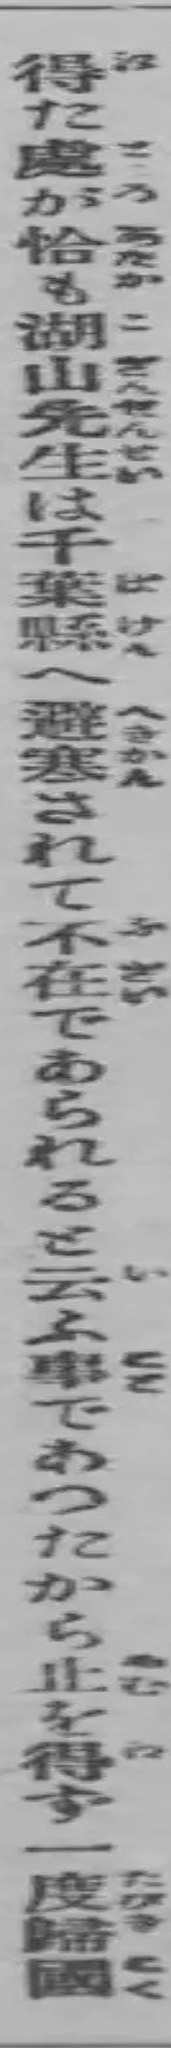得た処が恰も湖山先生は千葉県へ避寒されて不在であられると云ふ事であつたから止を得ず一度帰国
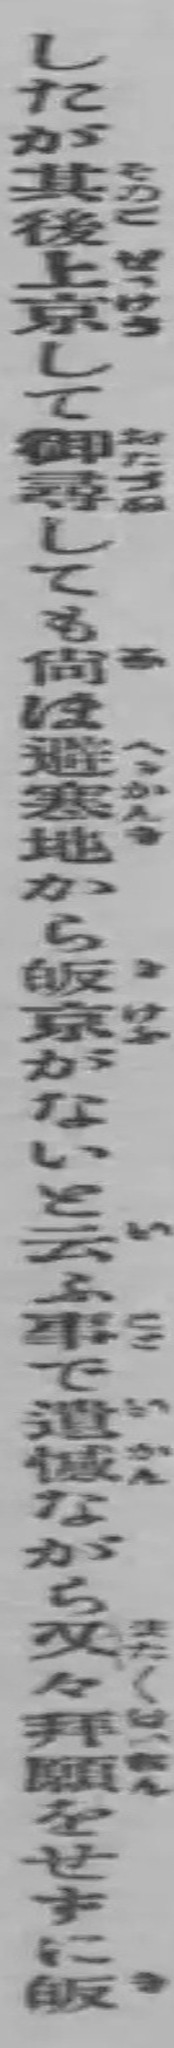湖山の幽閉したが其後上京して御尋しても尚ほ避寒地から皈京がないと云ふ事で遺憾ながら又々拝顔をせずに皈
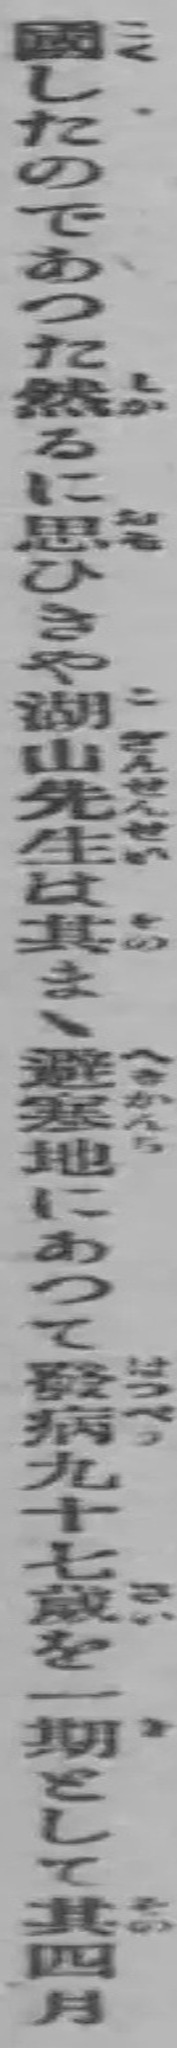国したのであつた然るに思ひきや湖山先生は其まゝ避寒地にあつて発病九十七歳を一期として其四月

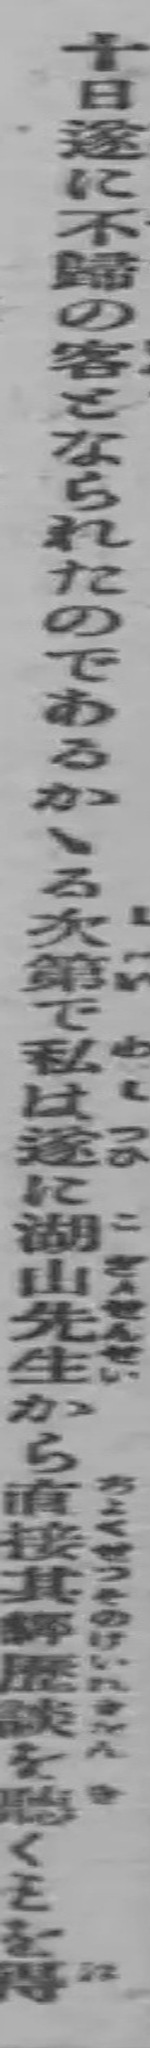十日遂に不帰の客となられたのであるかゝる次第で私は遂に湖山先生から直接其経歴談を聞くことを得
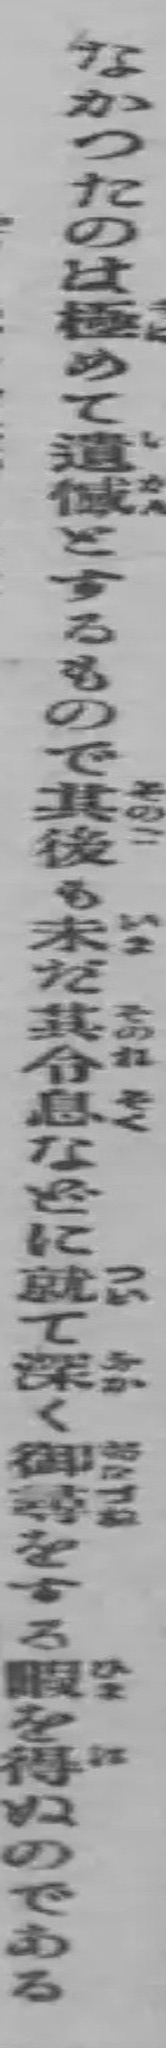なかつたのは極めて遺憾とするもので其後も未だ其令息などに就て深く御尋をする暇を得ぬのである
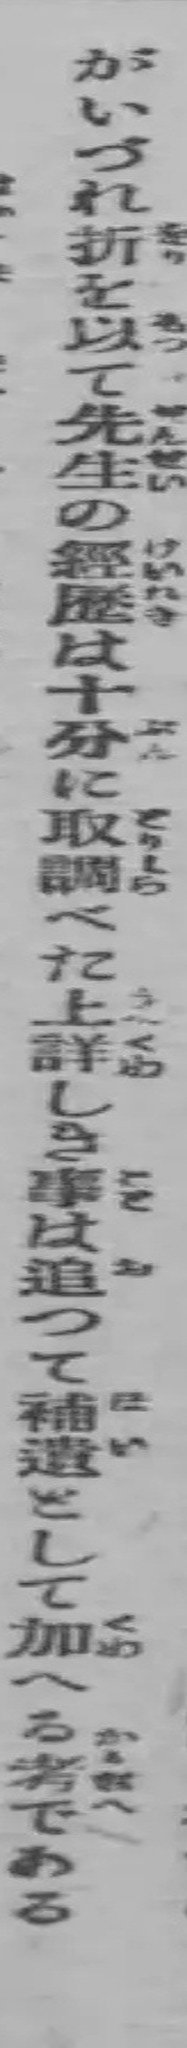がいづれ折を以て先生の経歴は十分に取調べた上詳しき事は追つて補遺として加へる考である
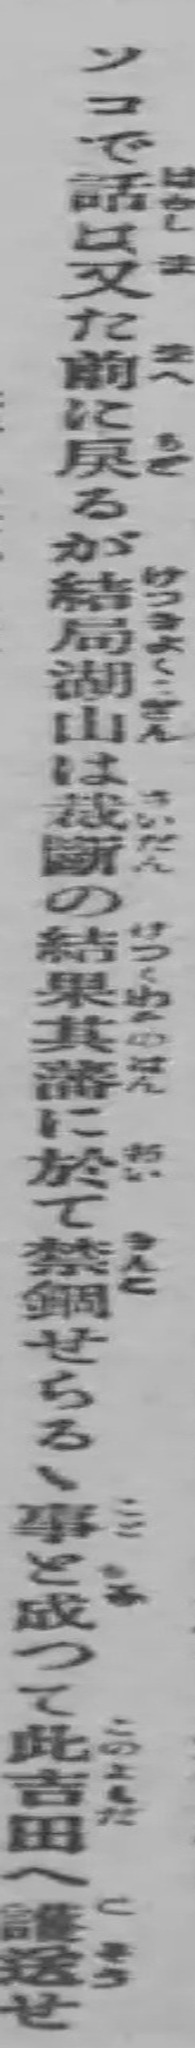ソコで話は又た前に戻るが結局湖山は裁断の結果其藩に於て禁錮せらるゝ事と成つて此吉田へ護送せ
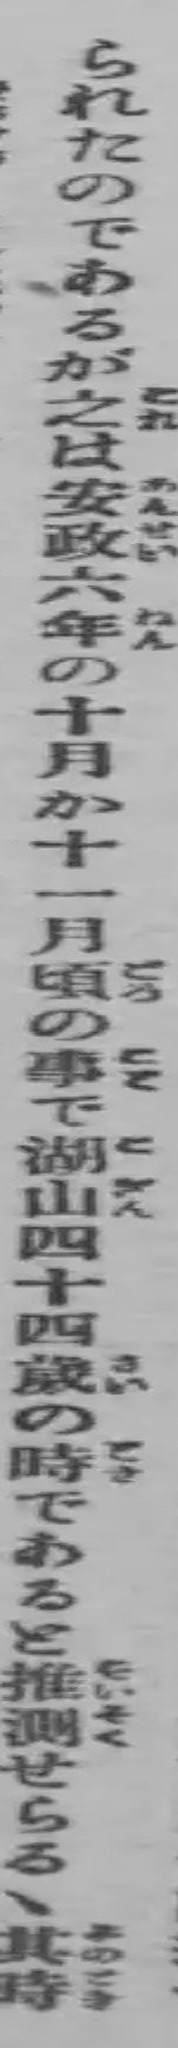られたのであるが之は安政六年の十月か十一月頃の事で湖山四十四歳の時であると推測せらるゝ其時
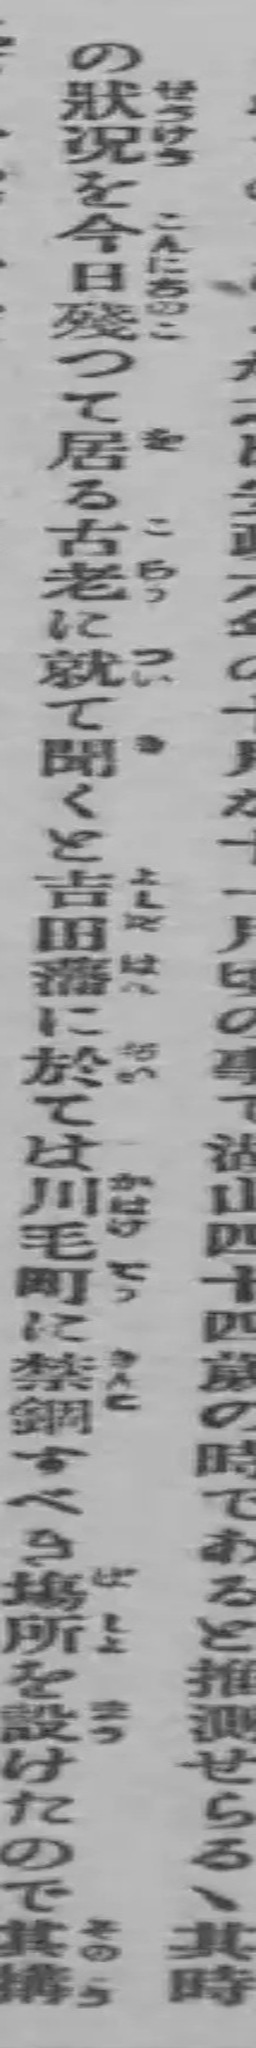の状況を今日残つて居る古老に就て聞くと吉田藩に於ては川毛町に禁錮すべき場所を設けたので其構
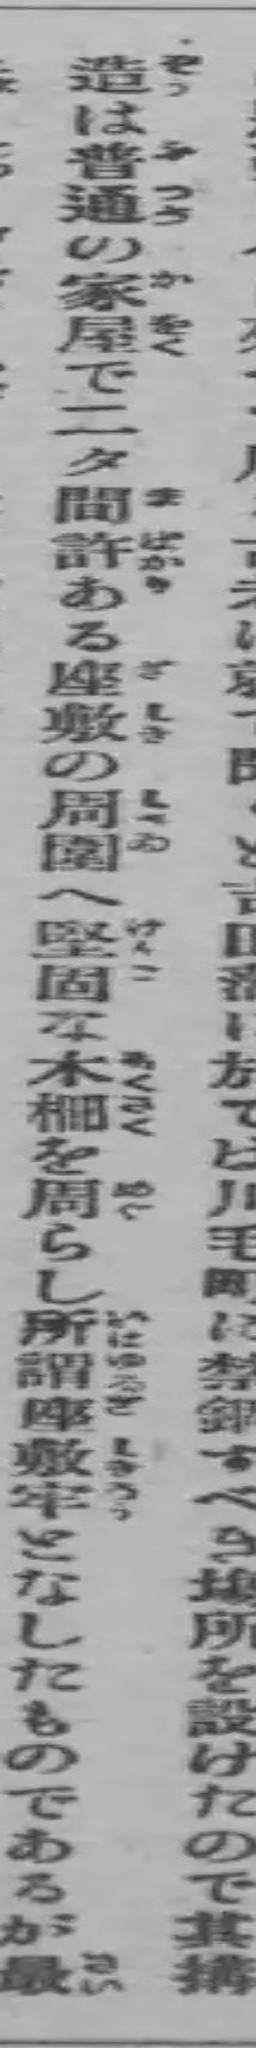造は普通の家屋で二タ間許ある座敷の周囲へ堅固な木柵を周らし所謂座敷牢となしたものであるが最
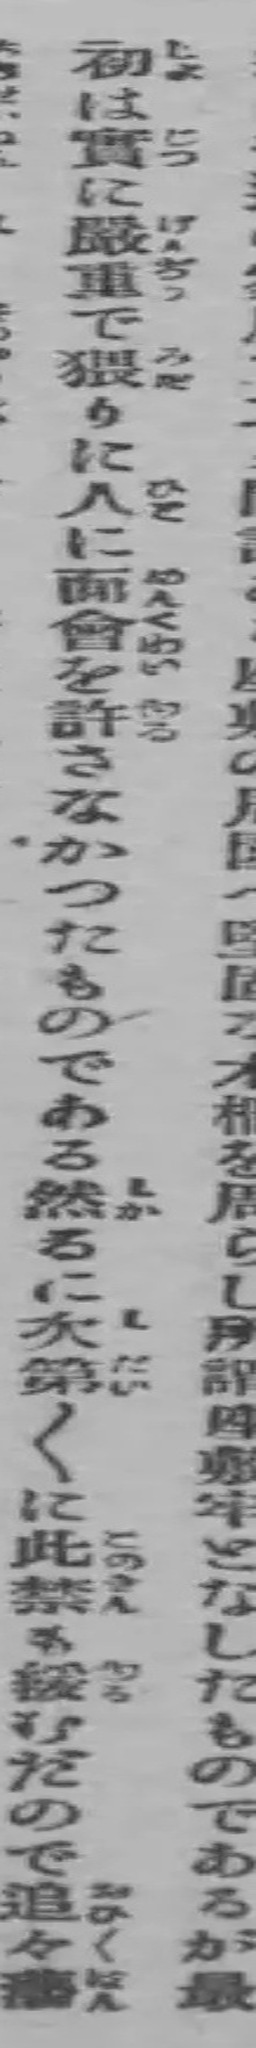初は実に厳重で猥りに人に面会を許さなかつたものである然るに次第〳〵に此禁も緩むだので追々藩
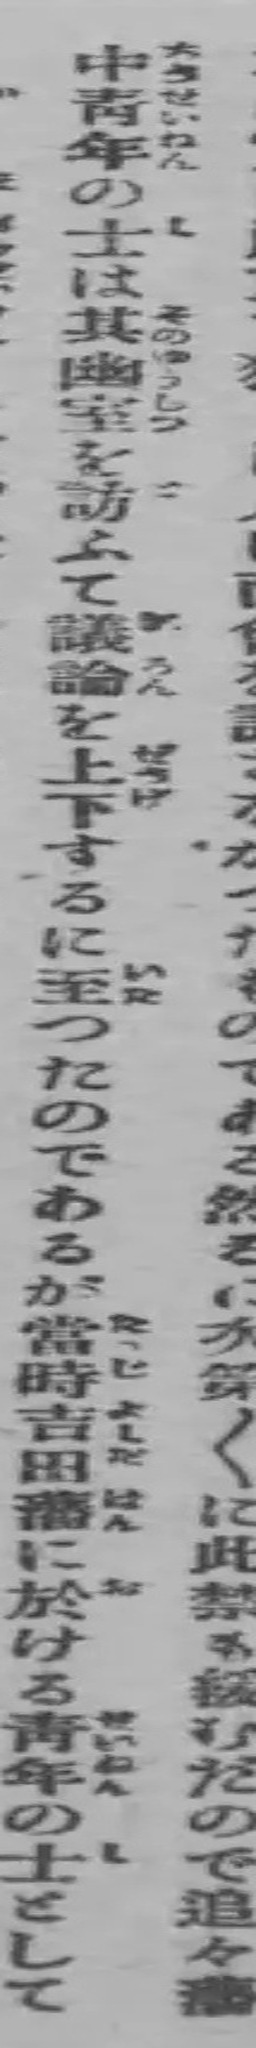中青年の士は其幽室を訪ふて議論を上下するに至つたのであるが当時吉田藩に於ける青年の士として
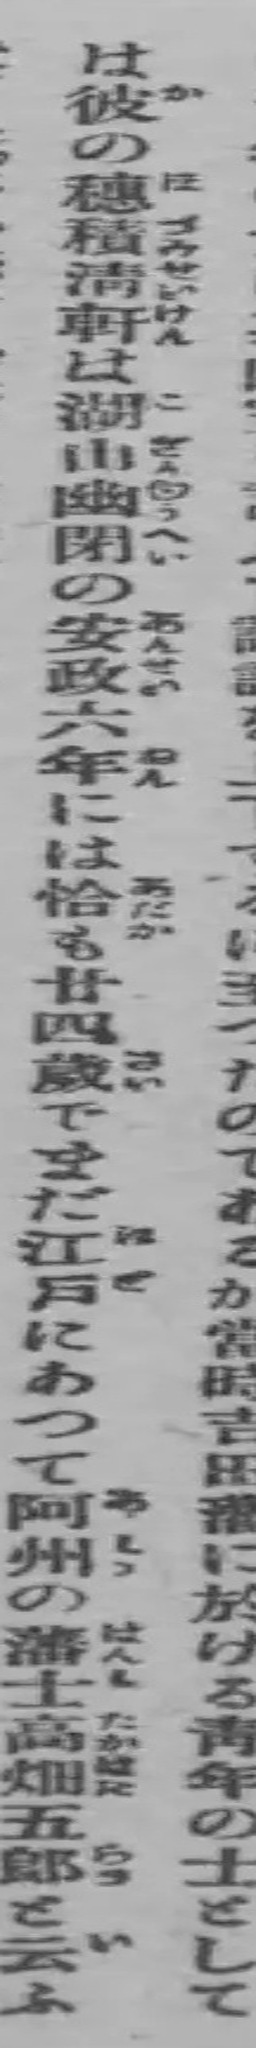は彼の穂積清軒は湖山幽閉の安政六年には恰も廿四歳でまだ江戸にあつて阿州の藩士高畑五郎と云ふ
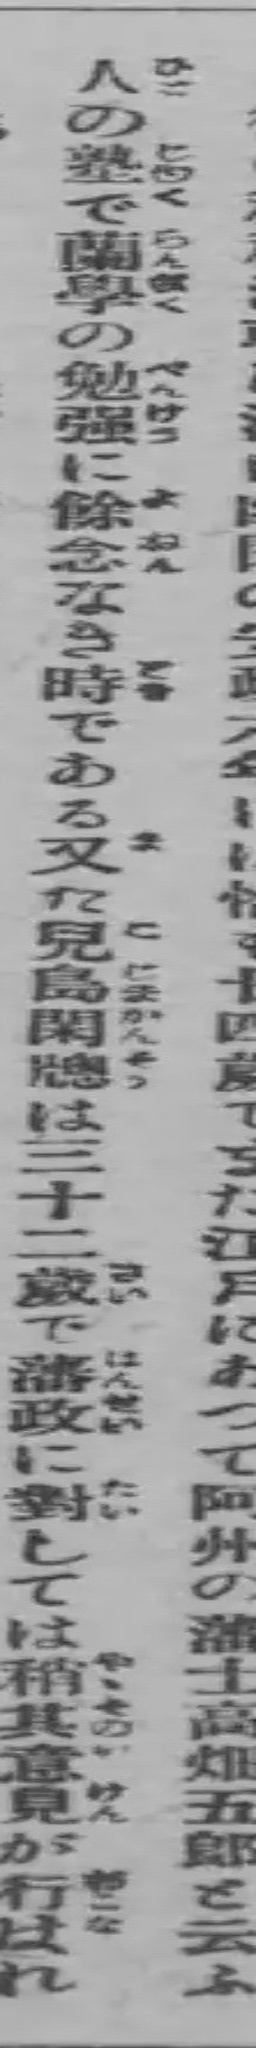人の塾で蘭学の勉強に余念なき時である又た児島閑牕は三十二歳で藩政に対しては稍其意見が行はれ
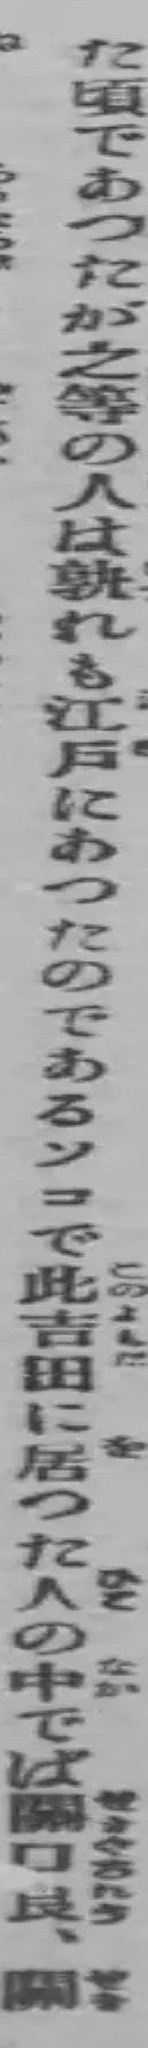た頃であつたが之等の人は孰れも江戸にあつたのであるソコで此吉田に居つた人の中では関口良、関
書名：豊橋市史談
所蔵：国立国会図書館 National Diet Library, JAPAN
